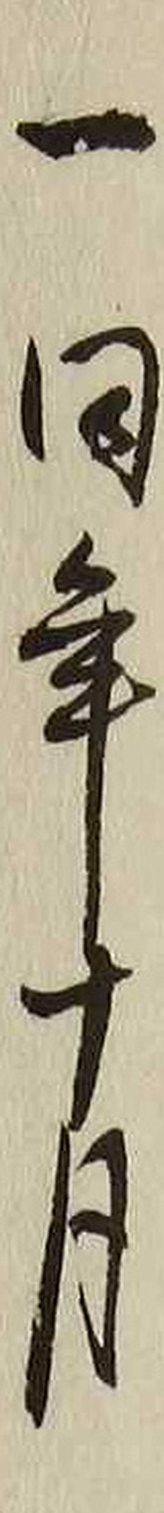一同年十月
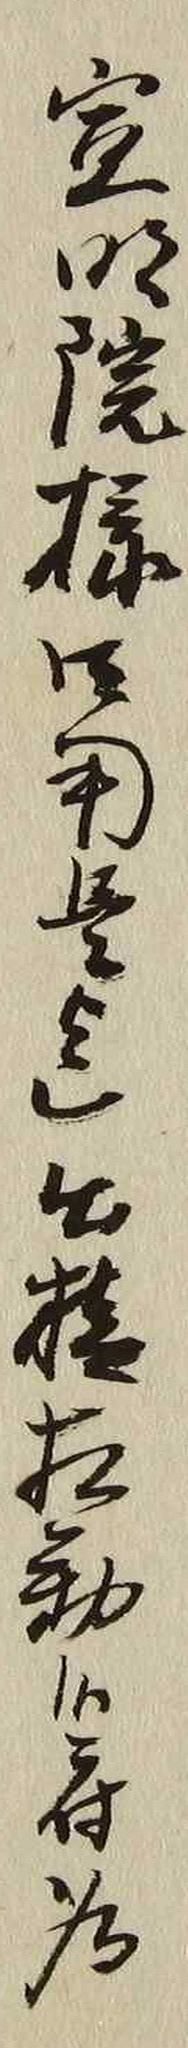宣明院様御用是迄出精相勤候ニ付為
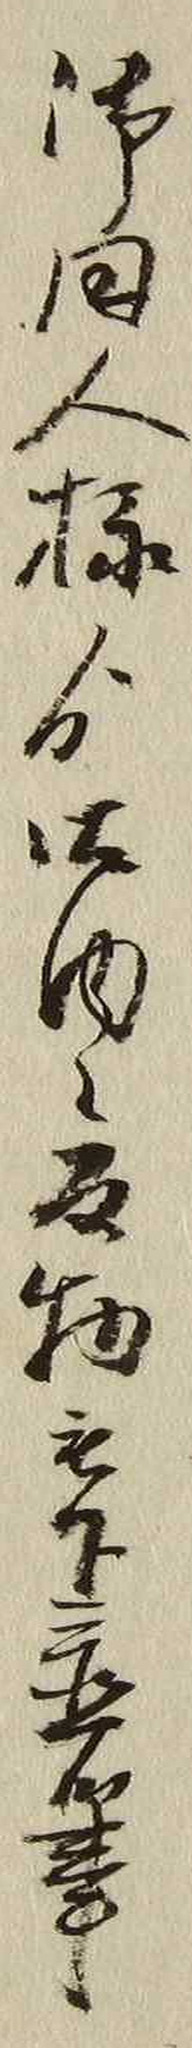御同人様ゟ御内々反物被下置候事
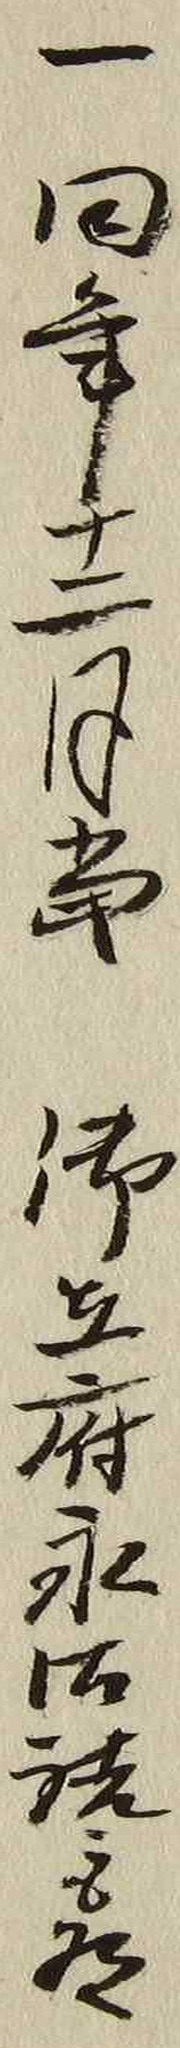一同年十二月当御在府永御詰ニも有
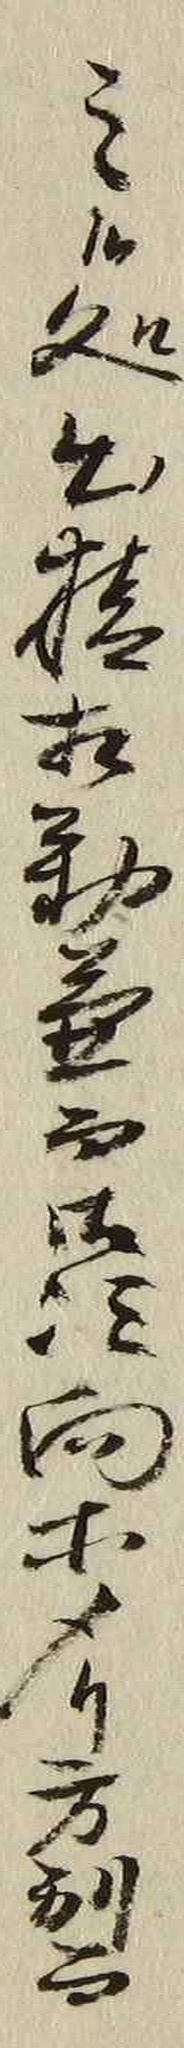之候処出精相勤兼而御次向等〆り方別而
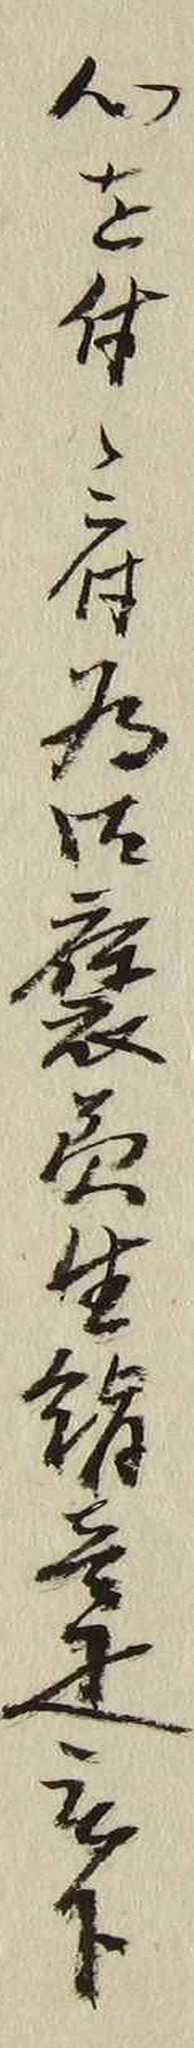心を付候ニ付為御褒美生絹壱疋被下
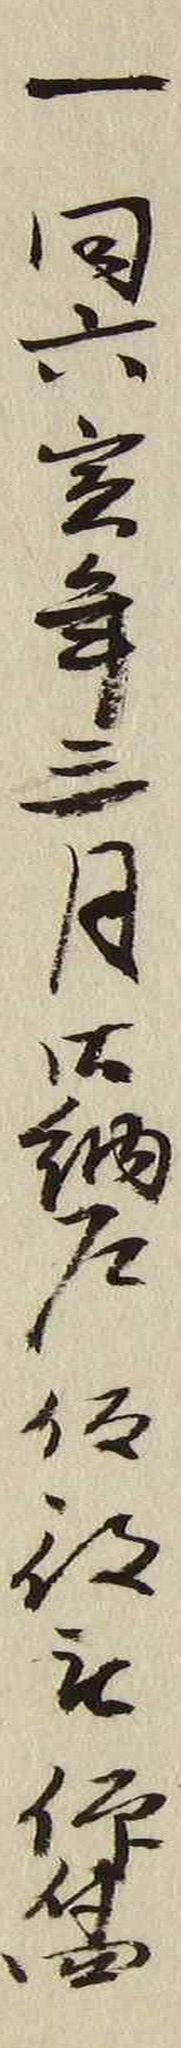一同六寅年三月御納戸仮役被仰付四
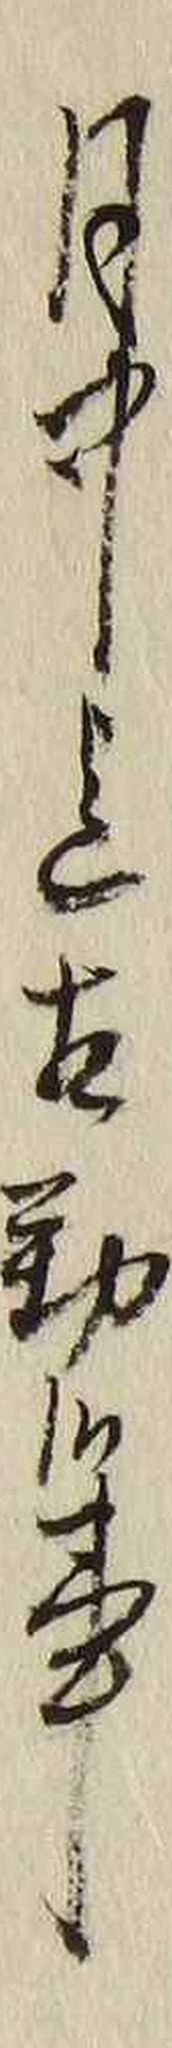月中迄相勤候事

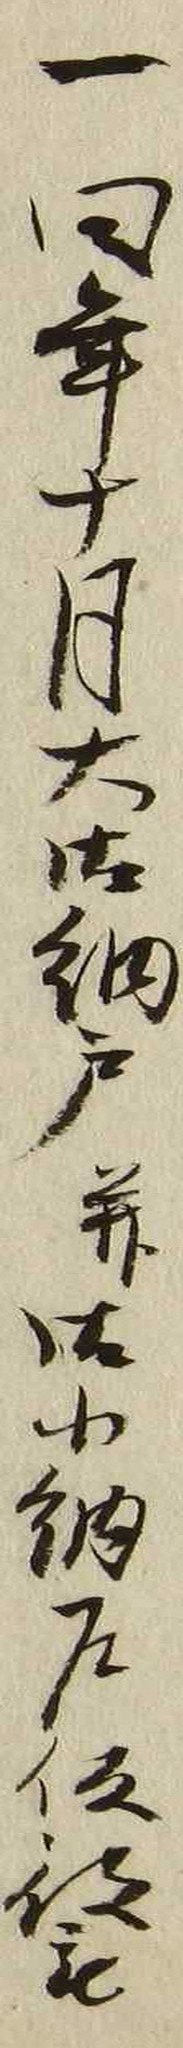一同年十月大御納戸并御小納戸仮役被
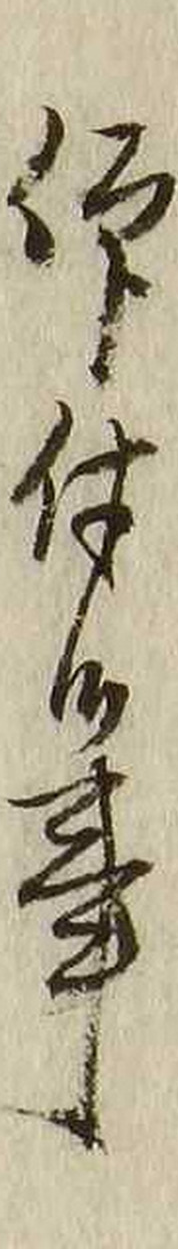仰付候事
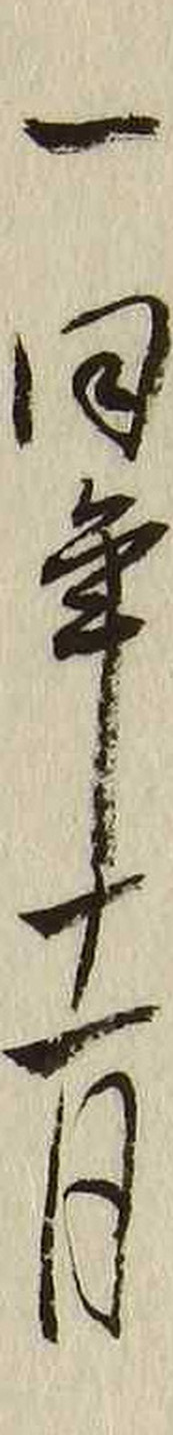一同年十一月
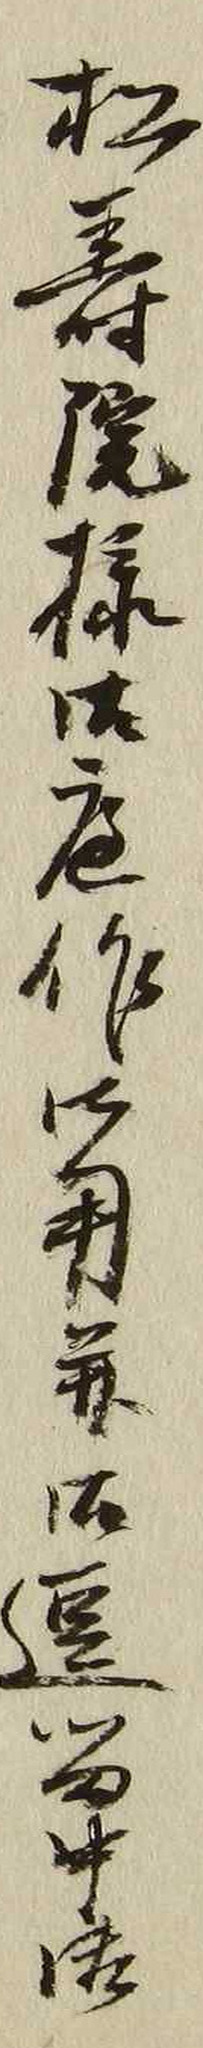松寿院様御庭作御用并御逗留中御
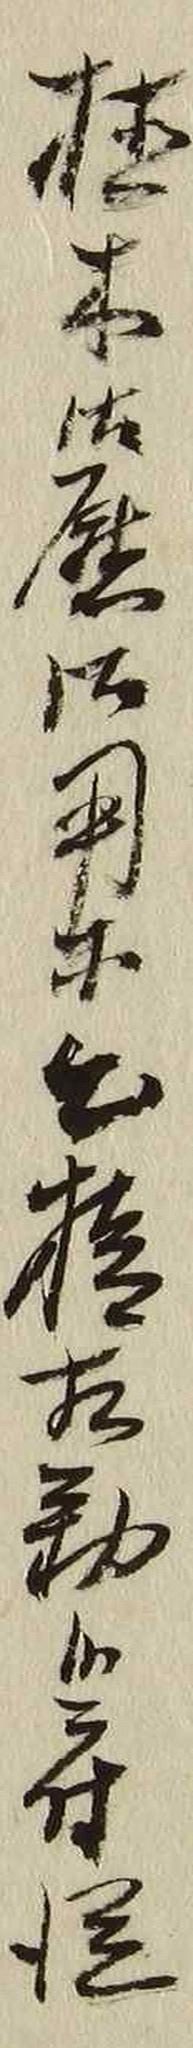植木御慰御用等出精相勤候ニ付従
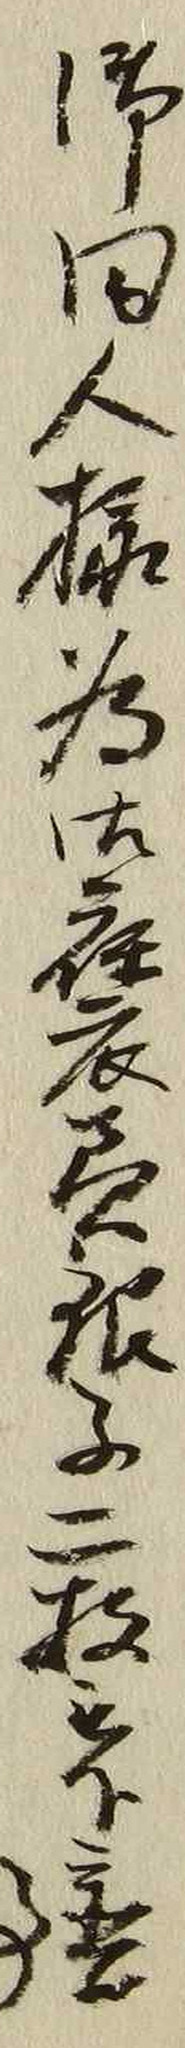御同人様為御褒美銀子二枚被下置候事
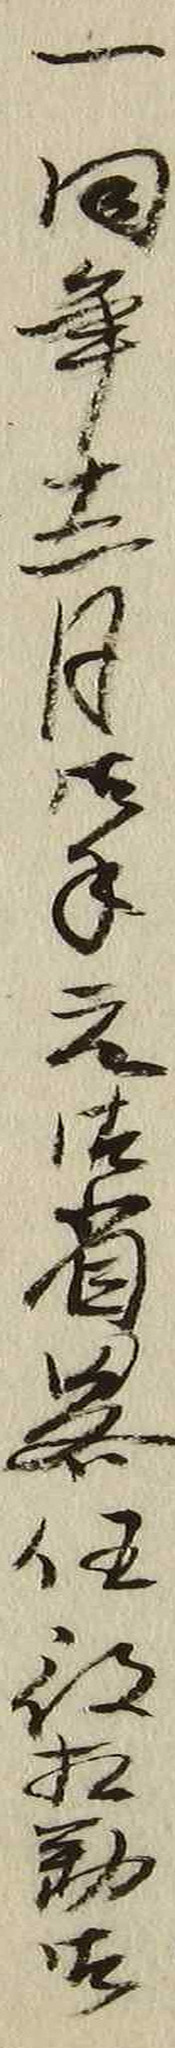一同年十二月御手元御省略任役相勤御
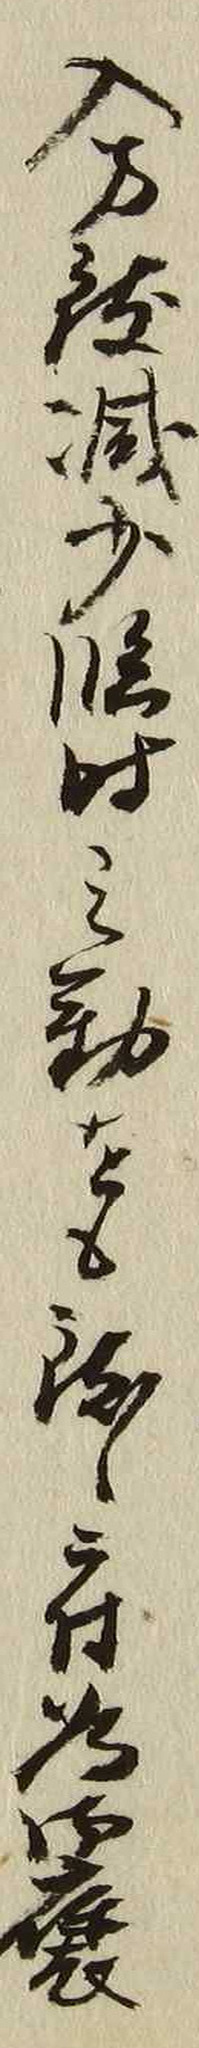入方致減少臨時之勤をも致候ニ付為御褒
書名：諸士系譜　巻之345　も之部1
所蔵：会津若松市立会津図書館
